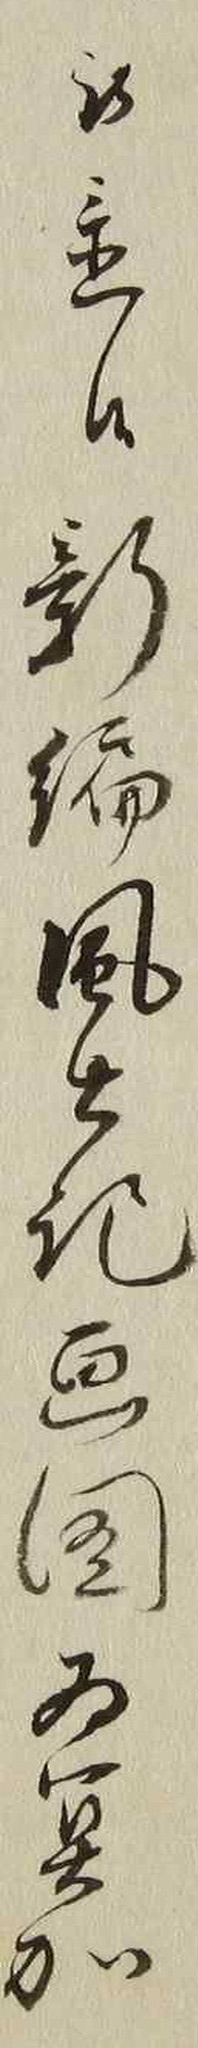被置候新編風土記画図為冥加
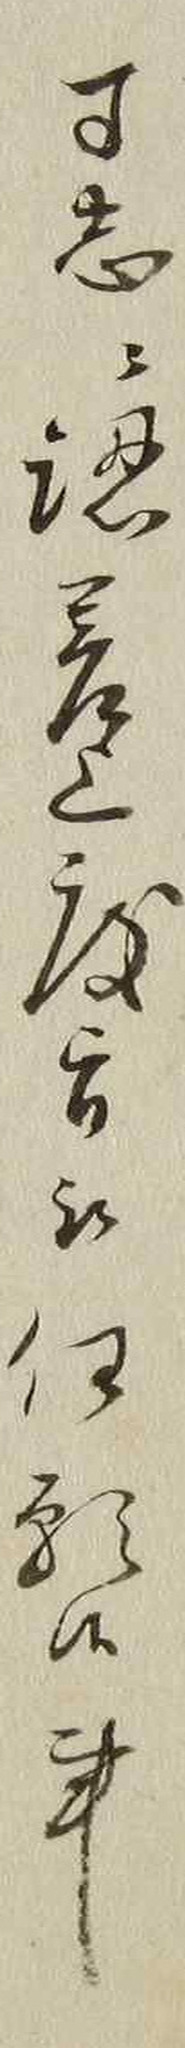寸志ニ認差上度旨被任願候事
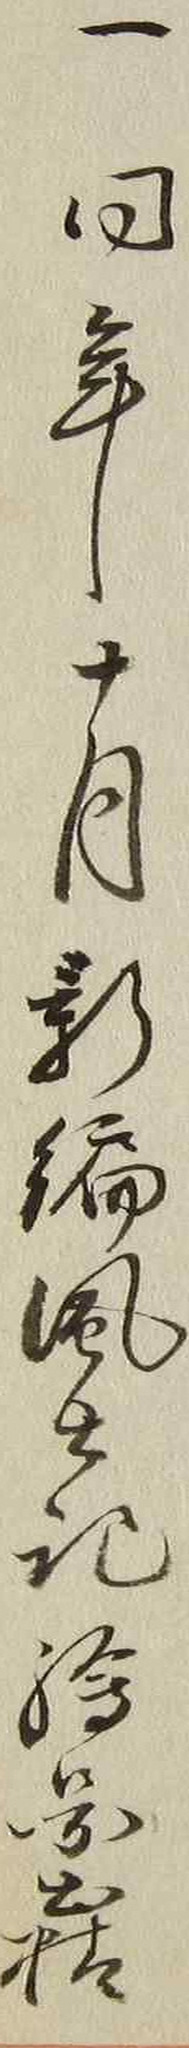一同年十月新編風土記絵図出精
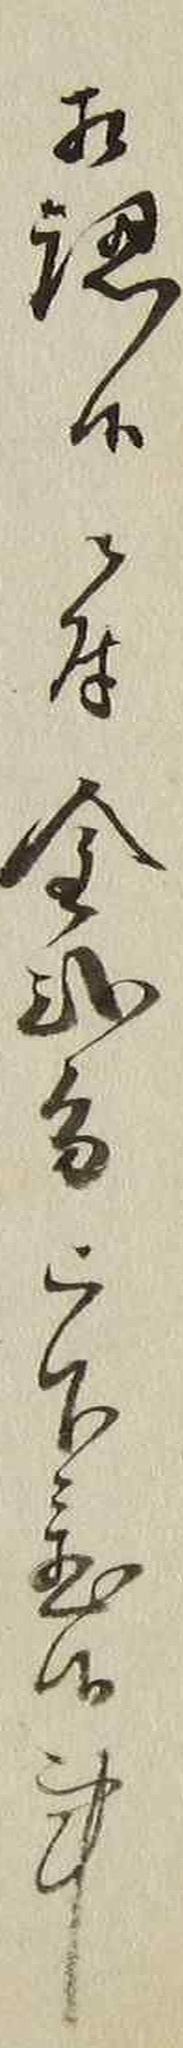相認候ニ付金弐分被下置候事
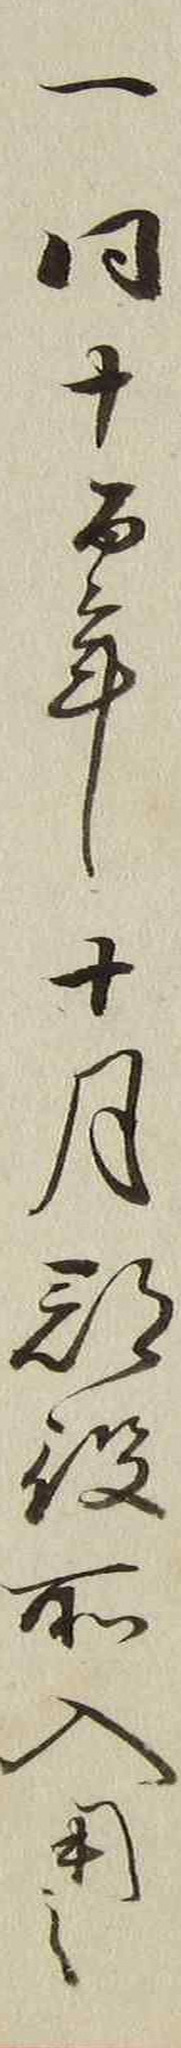一同十酉年十月部役所入用之
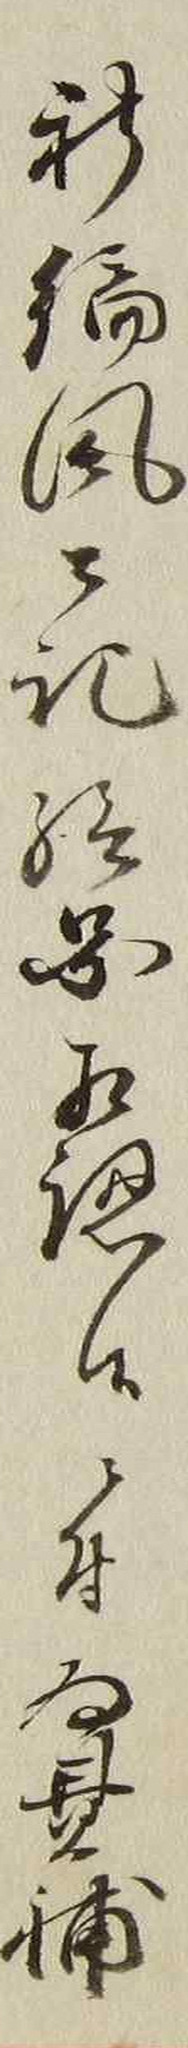新編風土記絵図相認候ニ付為費補
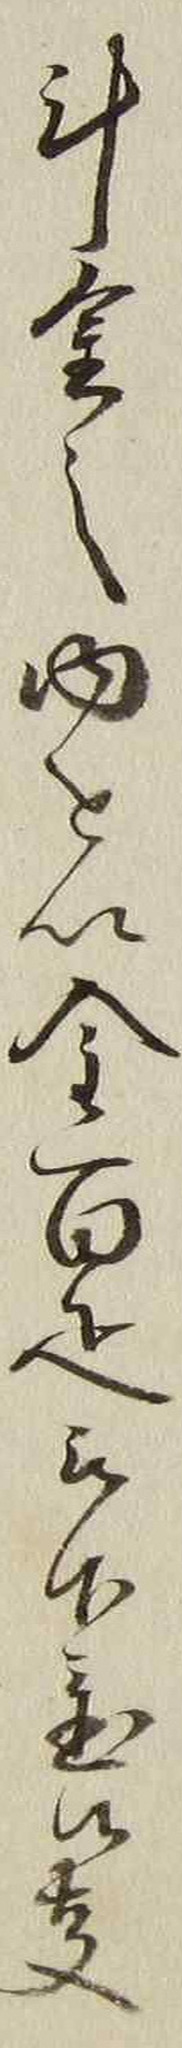計金之内を以金百疋被下置候事
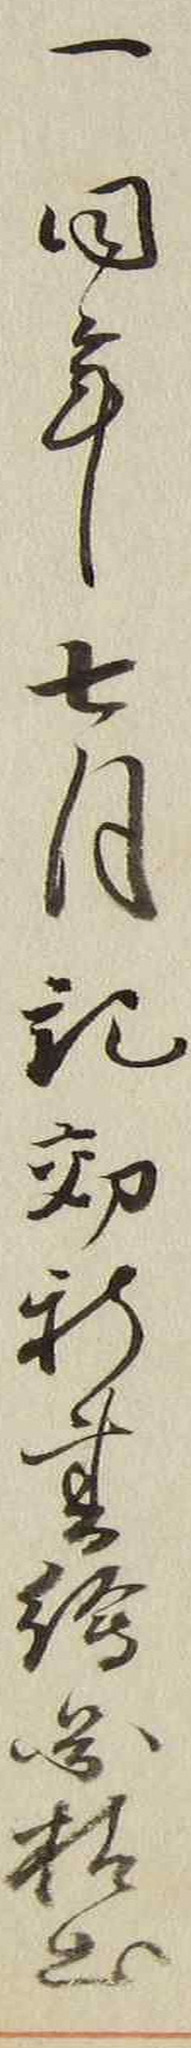一同年七月記効新書絵図精出
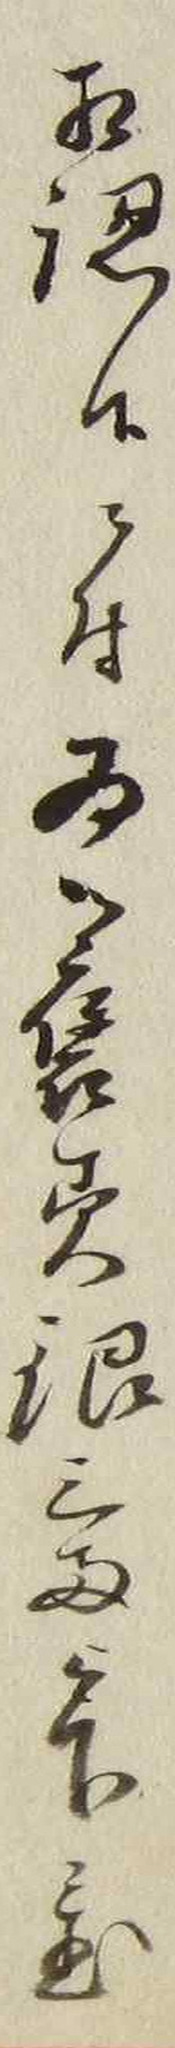相認候ニ付為御褒美銀三両被下置

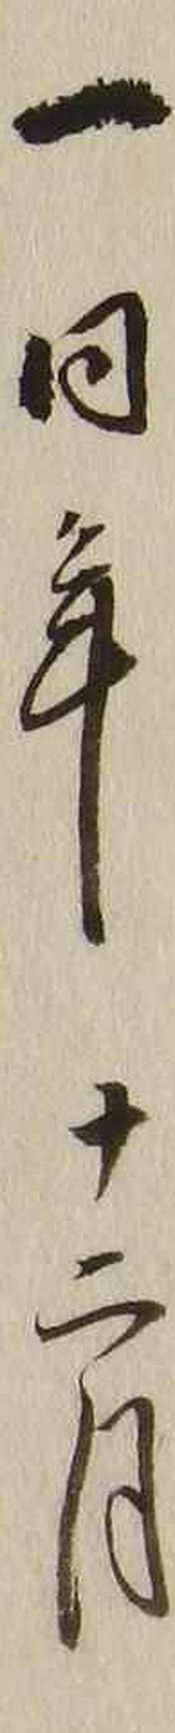一同年十二月
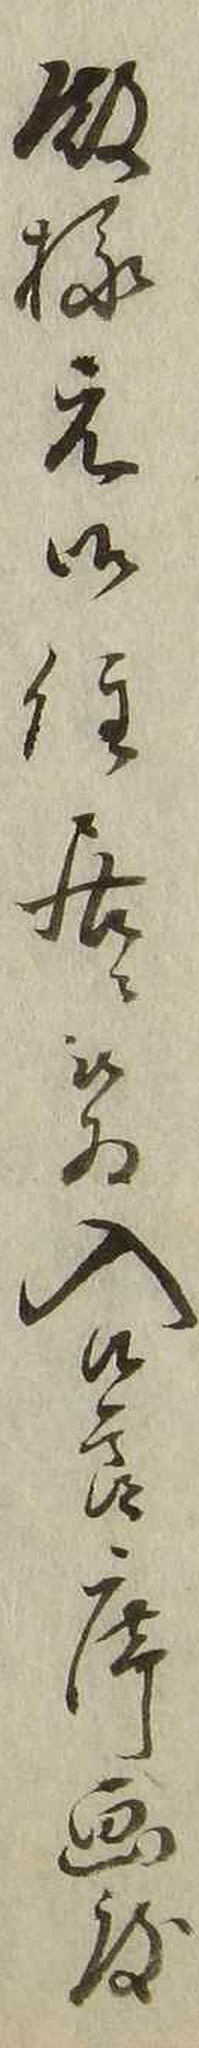殿様元御住居ニ被為入候節席画
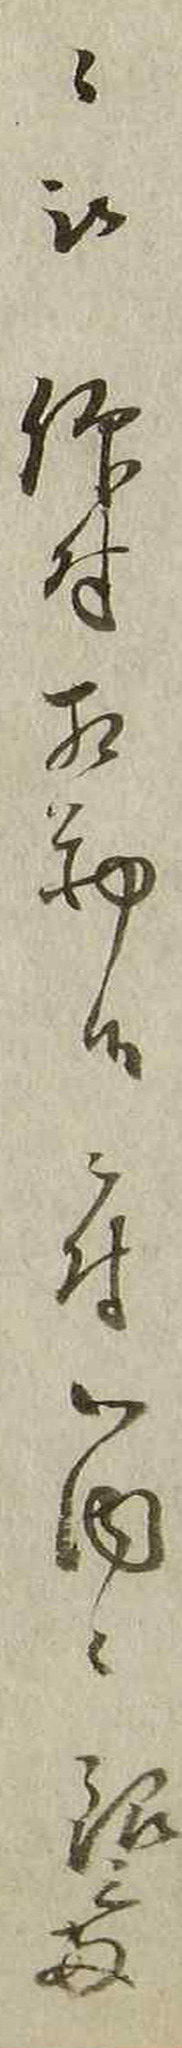々被仰付相勤候ニ付御内々ニ銀三両
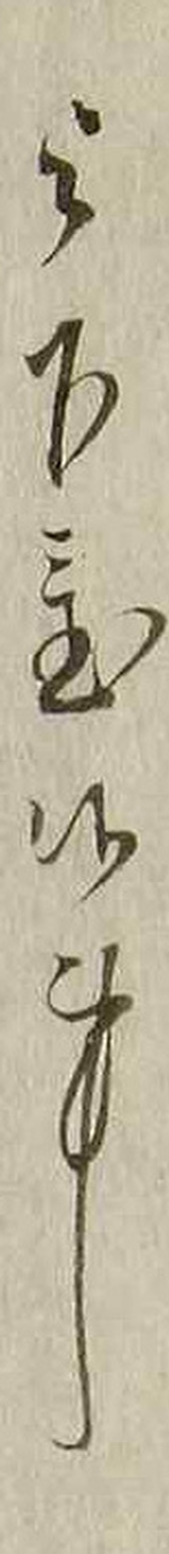被下置候事
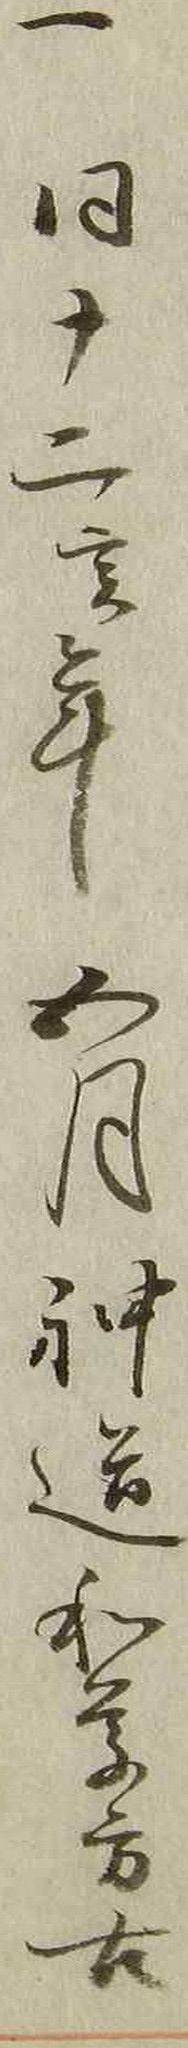一同十二亥年五月神道和学方古
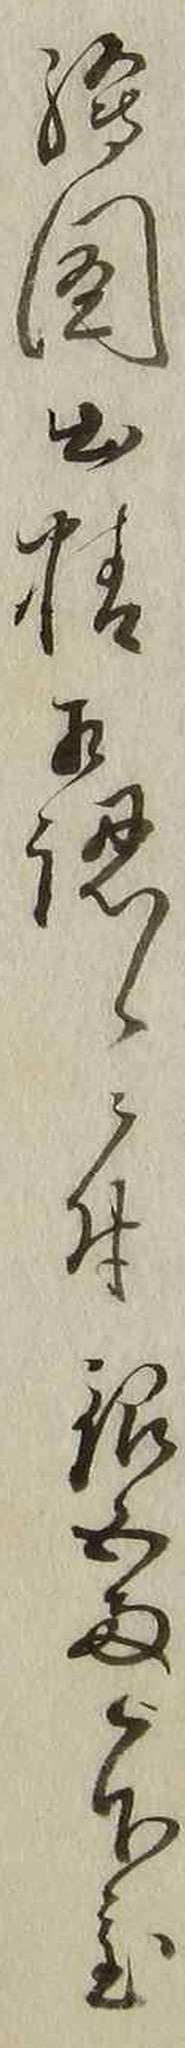絵図出精相認候ニ付銀五両被下置
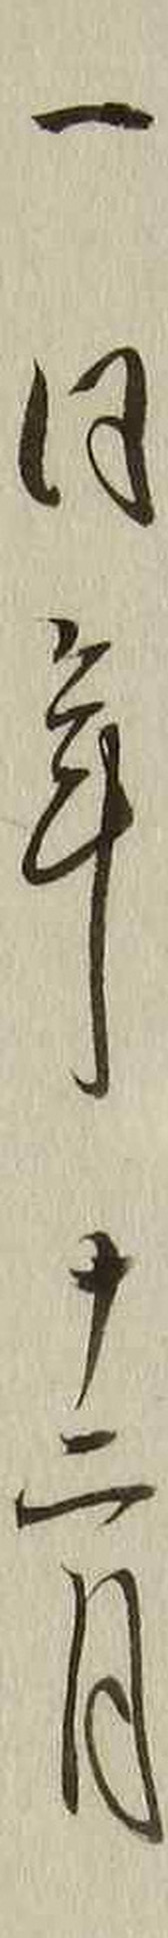一同年十二月
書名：諸士系譜　巻之132　た之部8
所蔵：会津若松市立会津図書館
